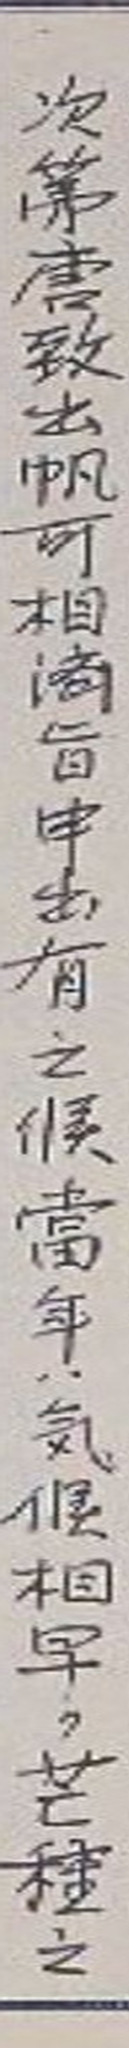次第唐致出帆可相済旨申出有之候当年は気候相早く芒種之
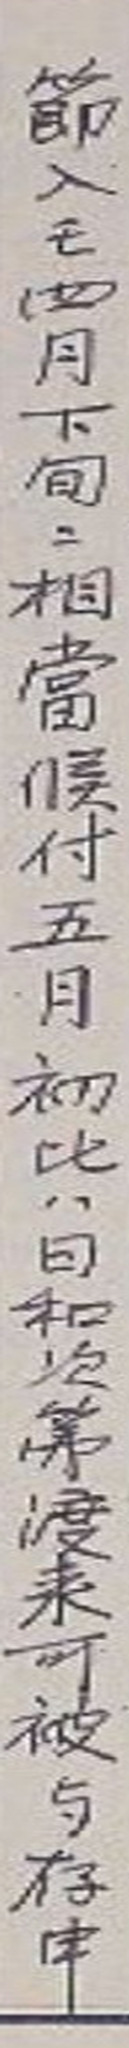節入も四月下旬に相当候付五月初比は日和次第渡来可被と存申
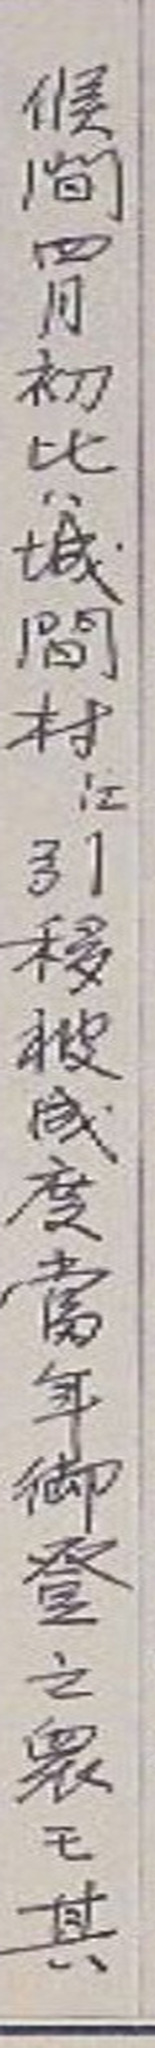候間四月初比は城間村え引移被成度当年御登之衆も其
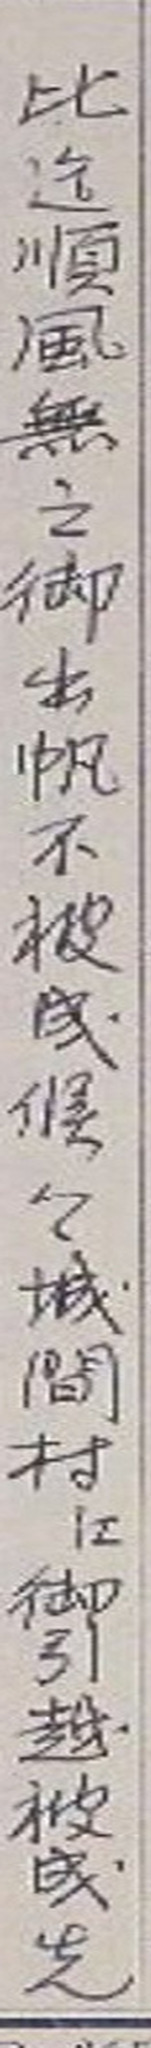比迄順風無之御出帆不被成候はゝ城間村え御引越被成先
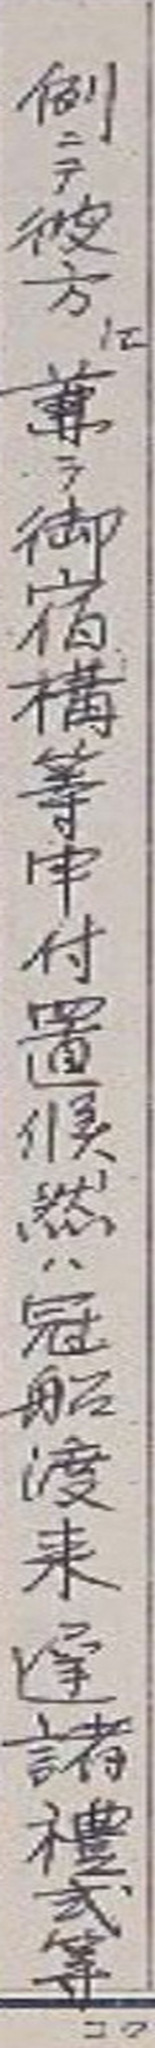例にて彼方え兼て御宿構等申付置候然は冠船渡来遅諸礼式等
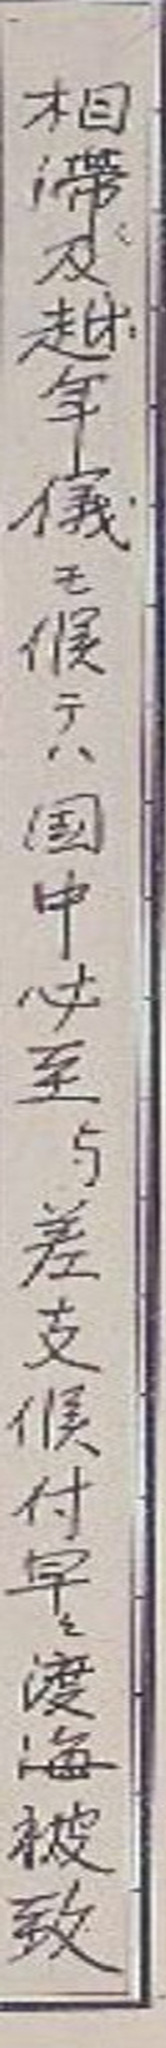相滞及越年儀も候ては国中必至と差支候付早々渡海被致
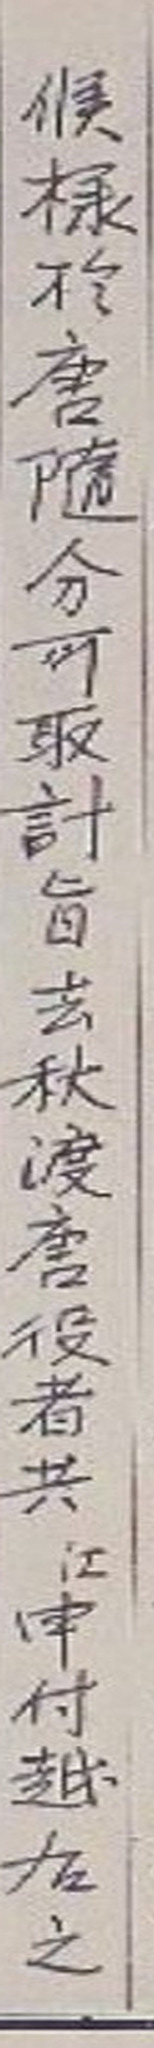候様於唐随分可取計旨去秋渡唐役者共え申付越右之
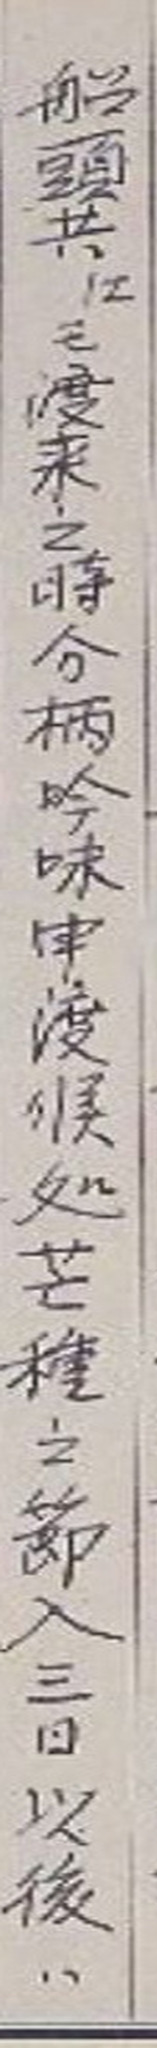船頭共えも渡来之時分柄吟味申渡候処芒種之節入三日以後は
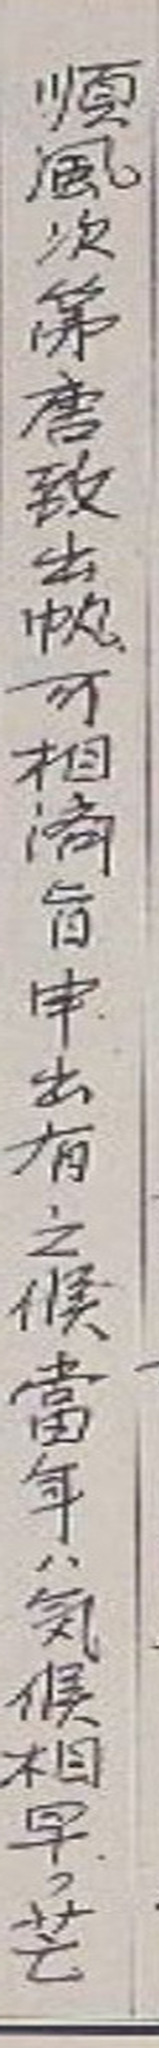順風次第唐致出帆可相済旨申出有之候当年は気候相早く芒
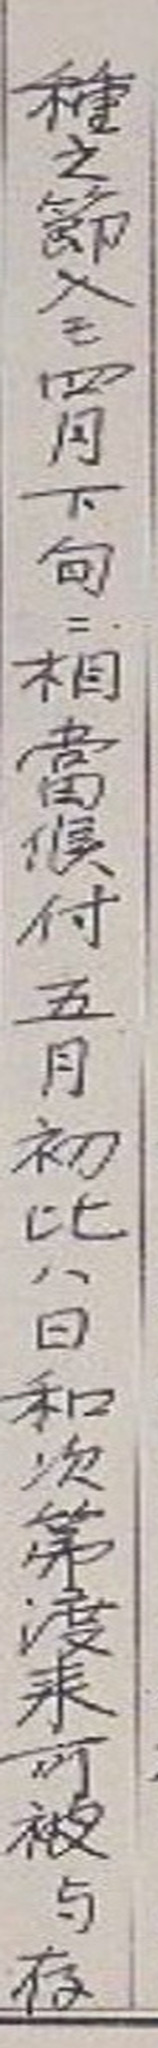種之節入も四月下旬に相当候付五月初比は日和次第渡来可被と存
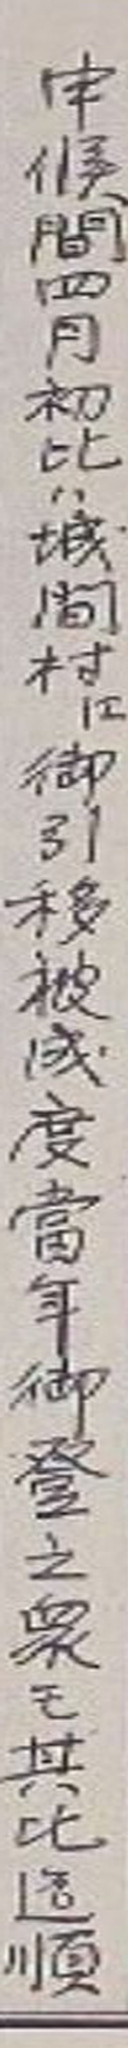申候間四月初比は城間村え御引移被成度当年御登之衆も其比迄順
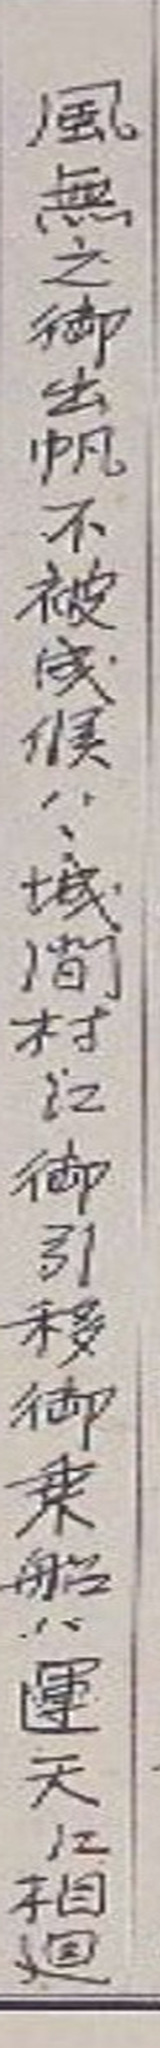風無之御出帆不被成候はゝ城間村え御引移御乗船は運天え相廻
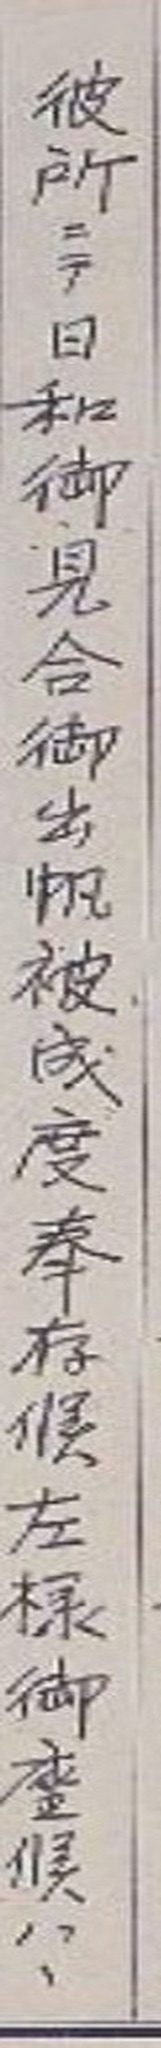彼所にて日和御見合御出帆被成度奉存候左様御座候はゝ
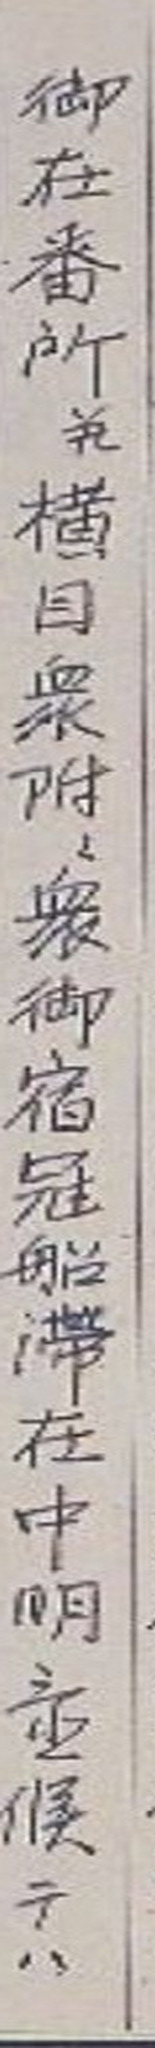御在番所并横目衆附々衆御宿冠船滞在中明置候ては
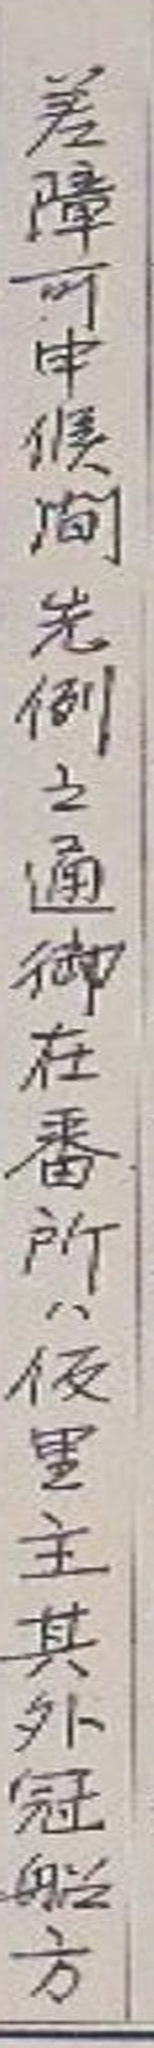差障可申候間先例之通御在番所は仮里主其外冠船方
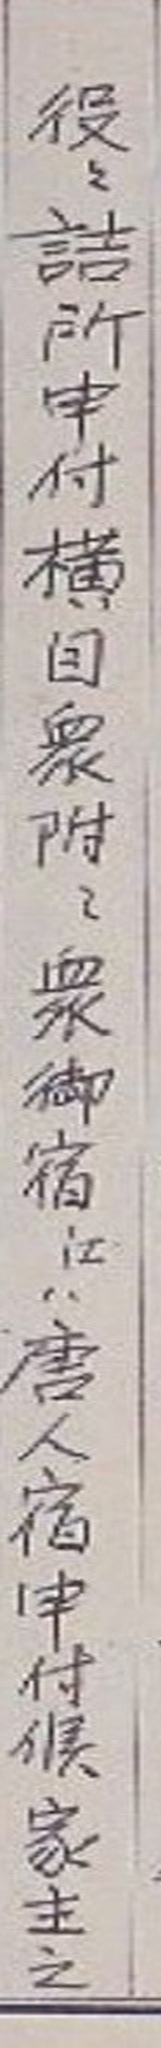役々詰所申付横目衆附々衆御宿えは唐人宿申付候家主之
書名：支那冊封使来琉諸記 下巻
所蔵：University of the Ryukyus Library
